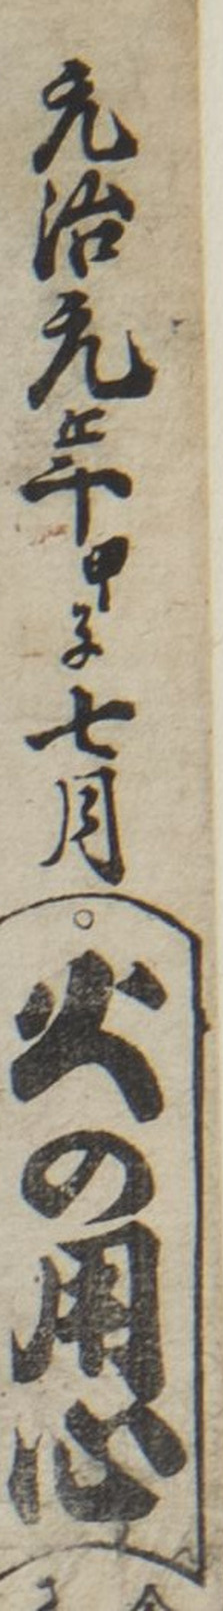元治元年甲子七月火の用心
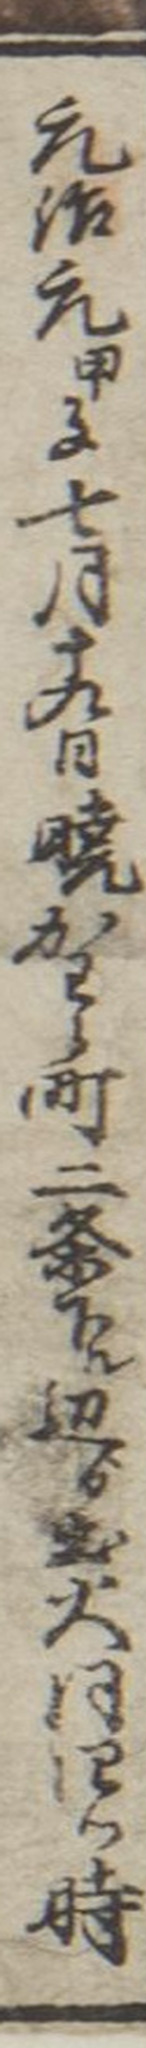元治元甲子七月十九日暁かわら町二条下る辺より出火同四つ時
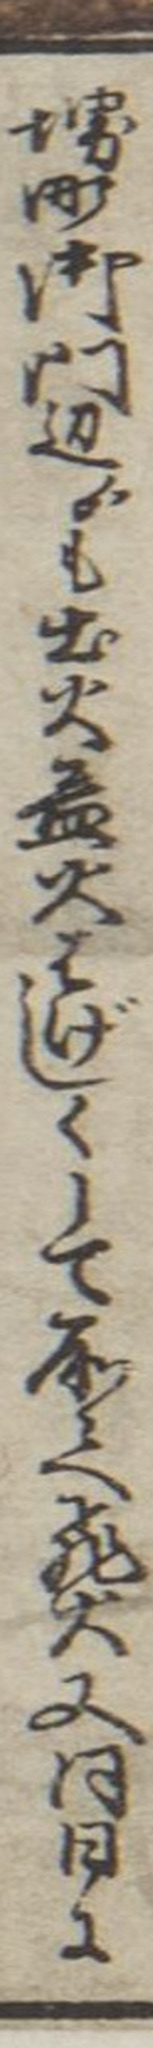堺町御門辺よりも出火孟火はげしくして所々へ飛火又同日に
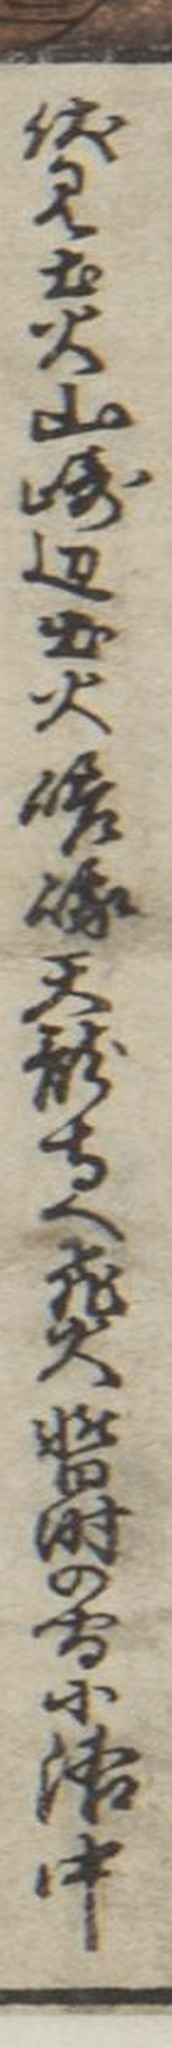伏見出火山崎辺出火嵯峨天龍寺へ飛火暫時の間に洛中
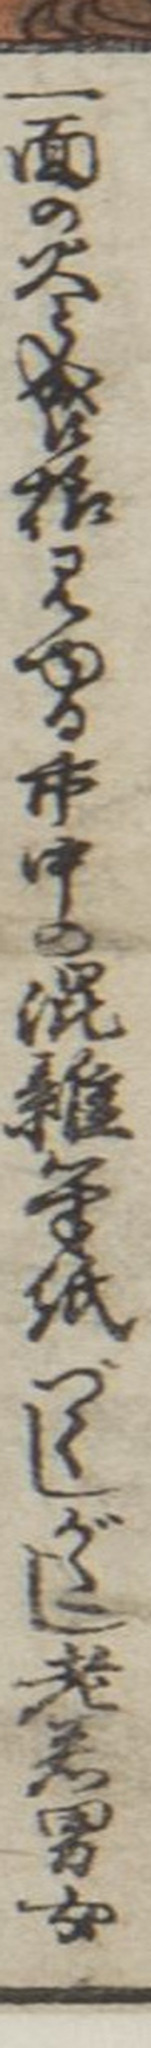一面の火と成候様見ゆる市中の混雑筆紙つくしがたし老若男女
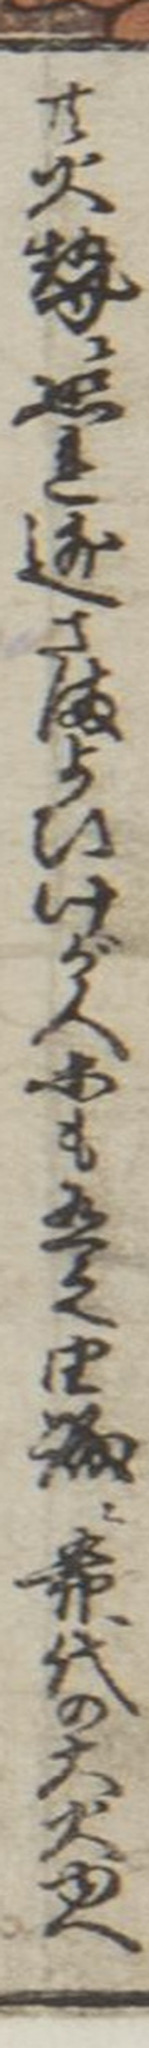共火勢に恐れ逃げさまよひけが人等も有之由誠に希代の大火ゆへ
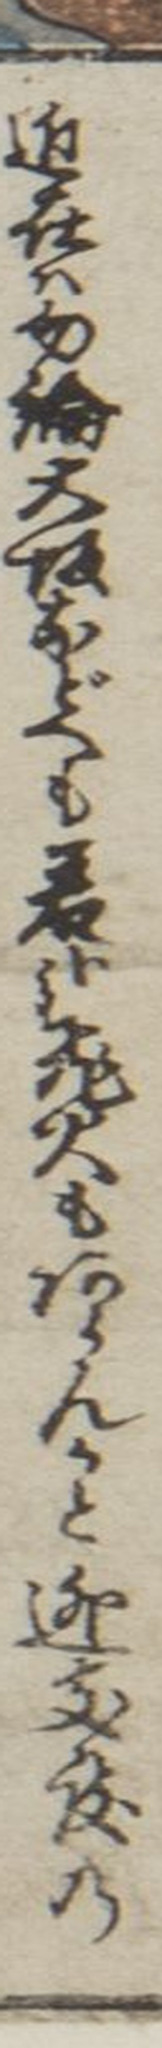近在は勿論大坂などへも若哉飛火もあらんかと逃支度の
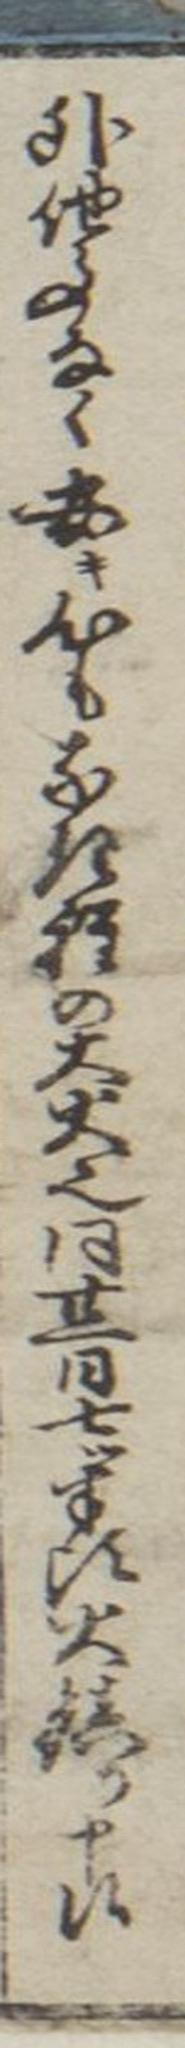外他事なく安き心もなき程の大火也同廿一日七ッ半頃火鎮り申候
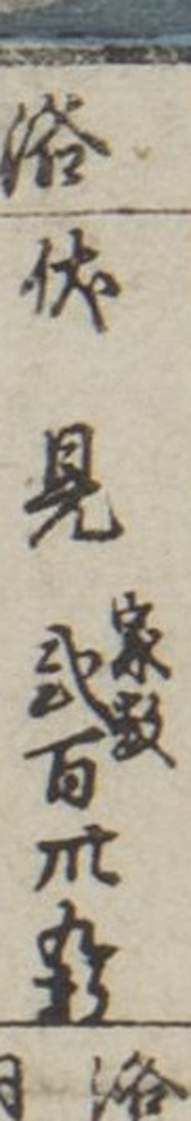洛伏見弐百卅九軒
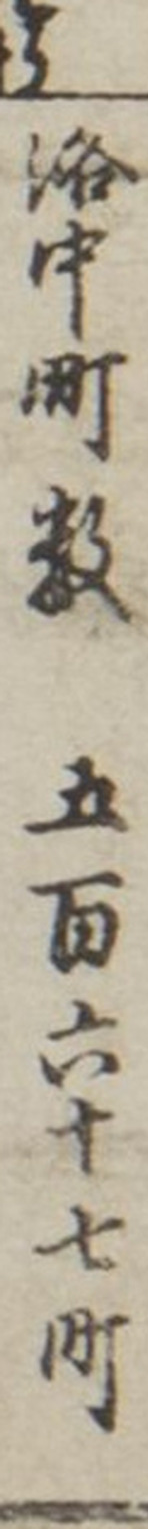洛中町数五百六十七町
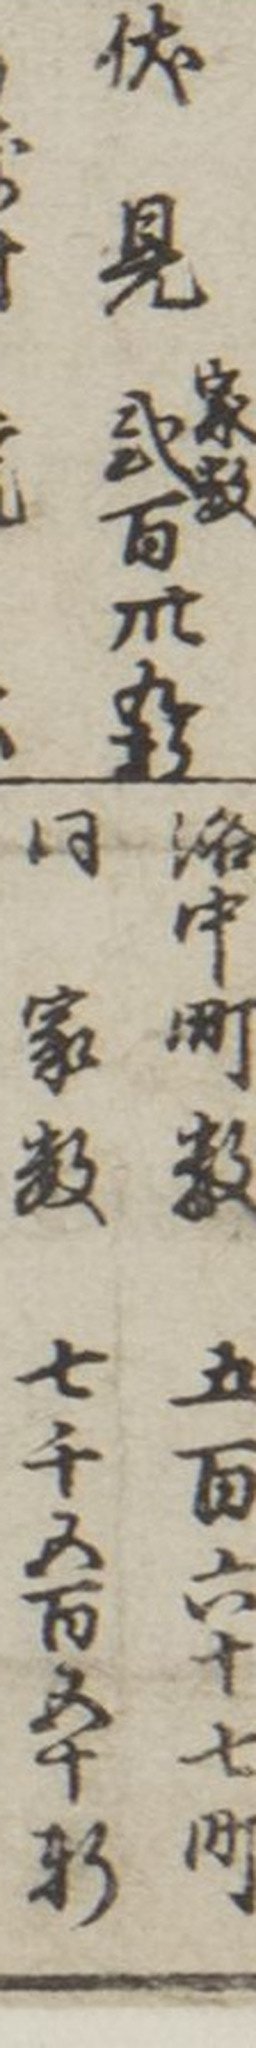同家数七千五百五十軒
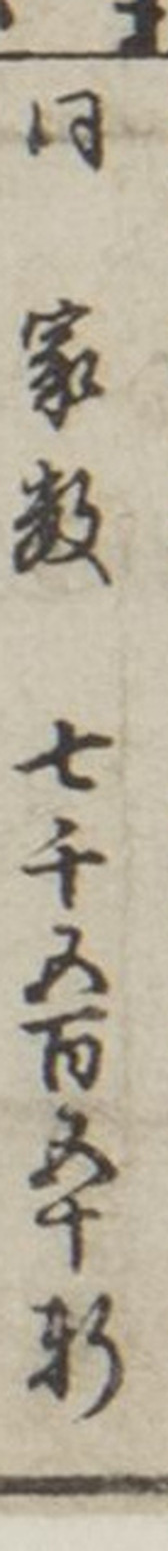同家数七千五百五十軒
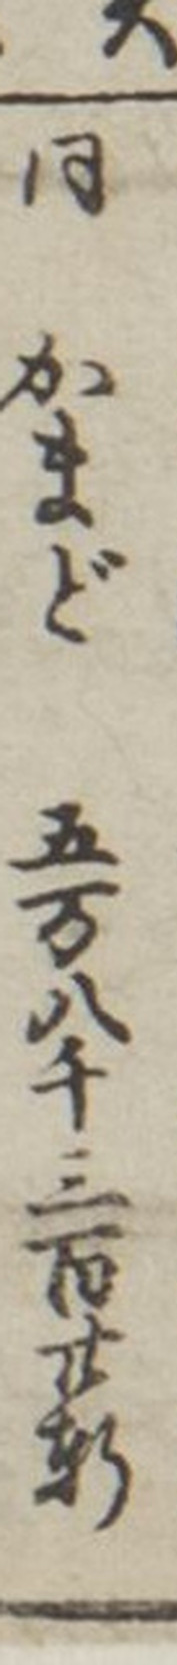同かまど五万八千三百廿軒
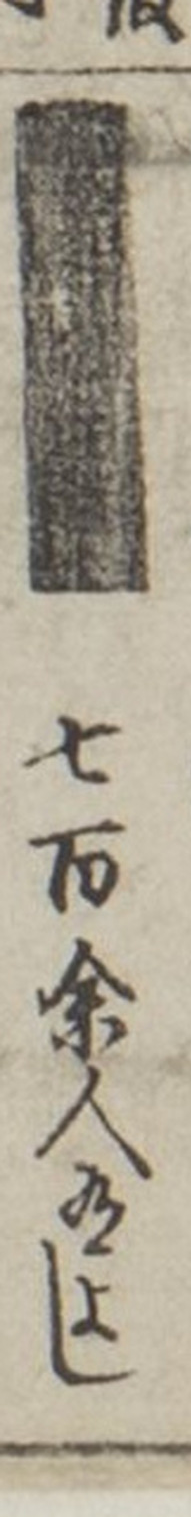七百余人有よし
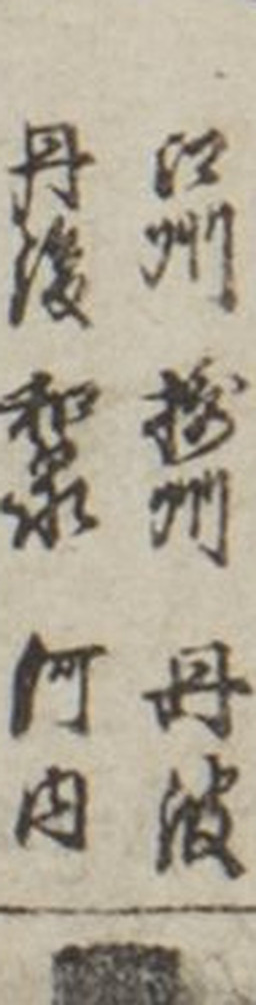丹後和泉河内
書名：平安大火末代噺
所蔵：あいおいニッセイ同和損保株式会社
